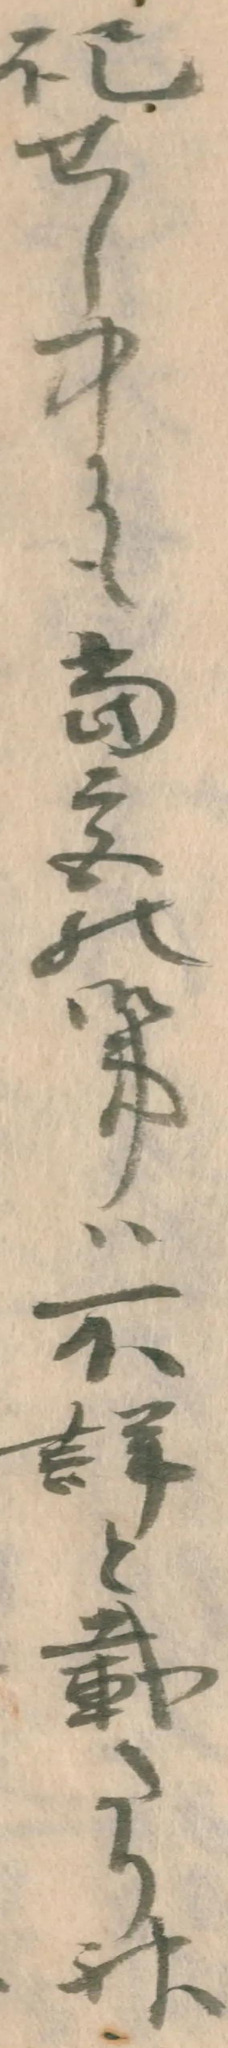記せし中にも当宮の御事は不詳と載たり神
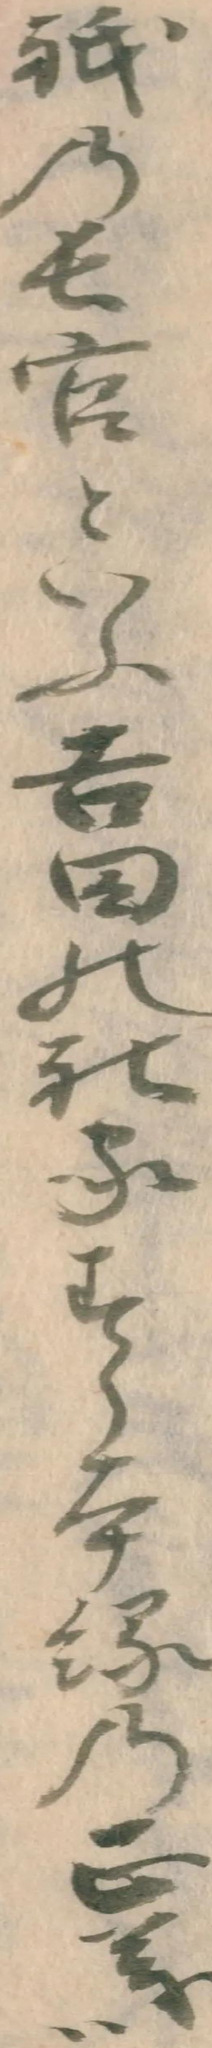祇の長官といふ吉田の社家すら本縁の正義は
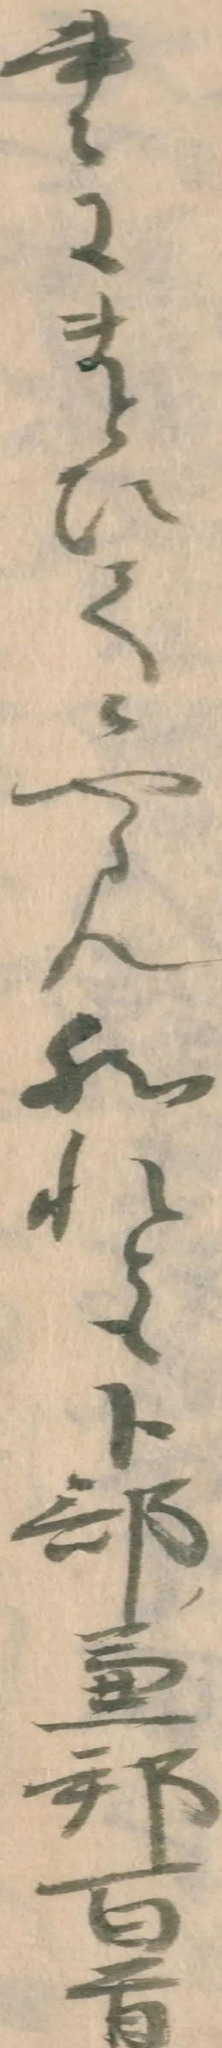書々にまとひて候やらん然れとも卜部兼邦百首
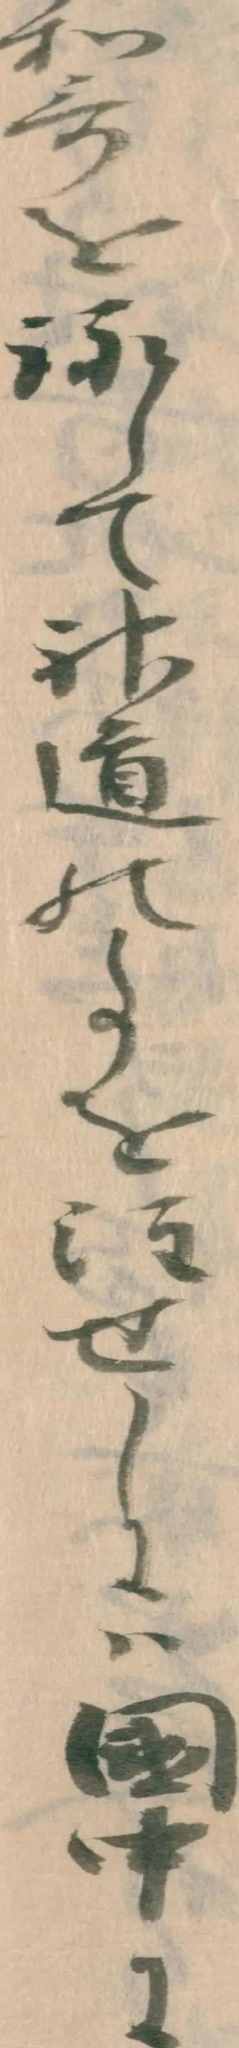和哥を詠して神道の事を注せしには国中に
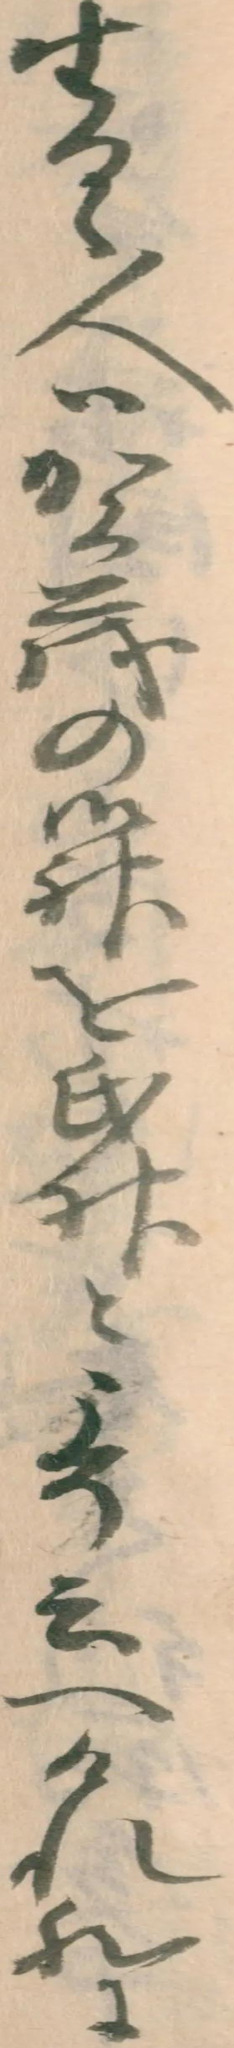生るゝ人は賀茂の御神を氏神とこそ云へけれ然に
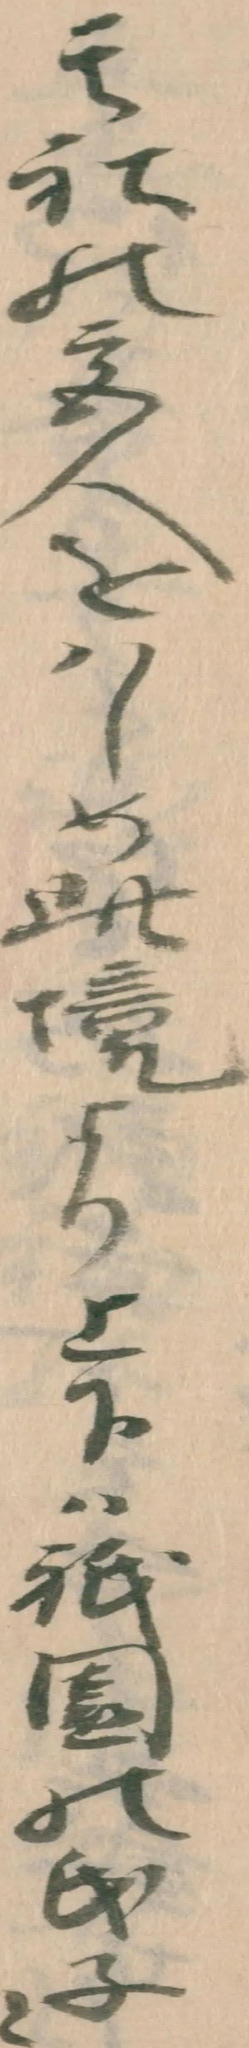其社の宮人をはしめ此境より上下は祇園の氏子と
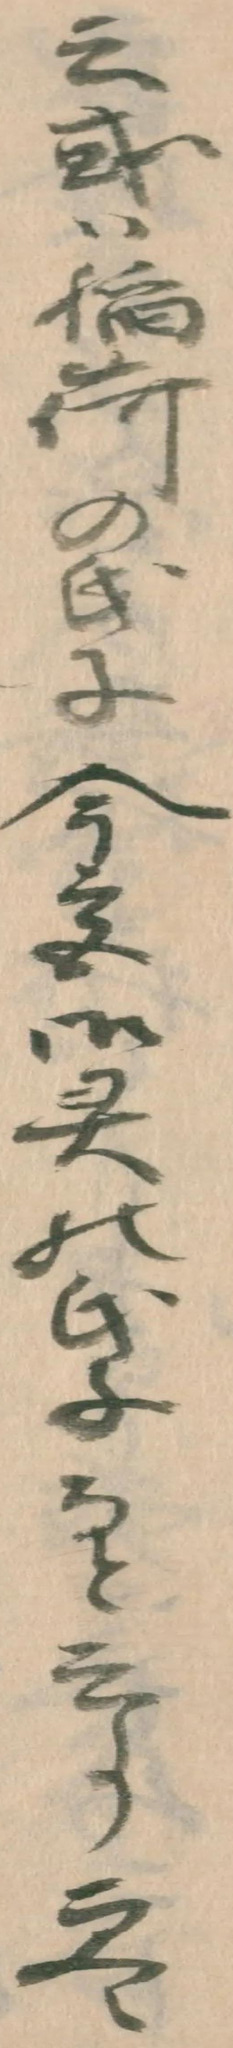云或は稲荷の氏子今宮御霊の氏子なと云事更々
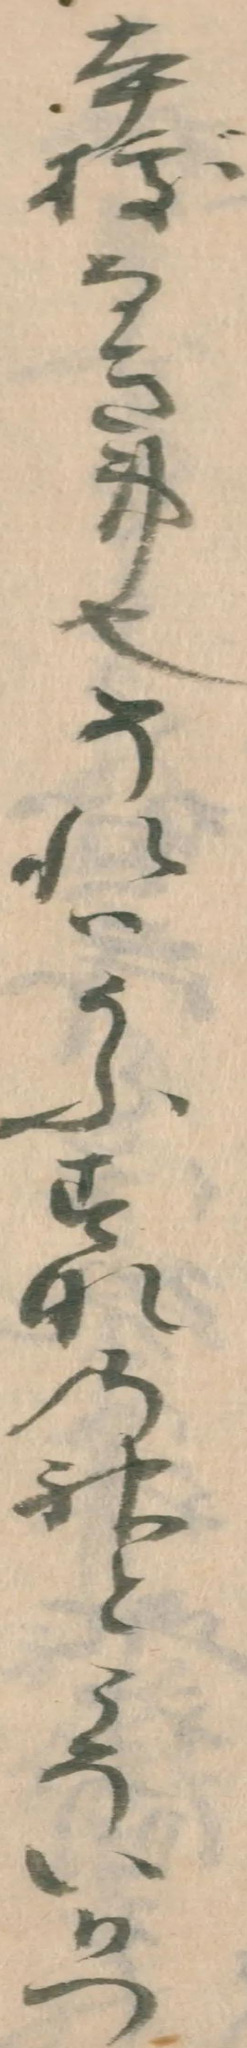本拠なき事也それはうふすなの神とこそいひつ
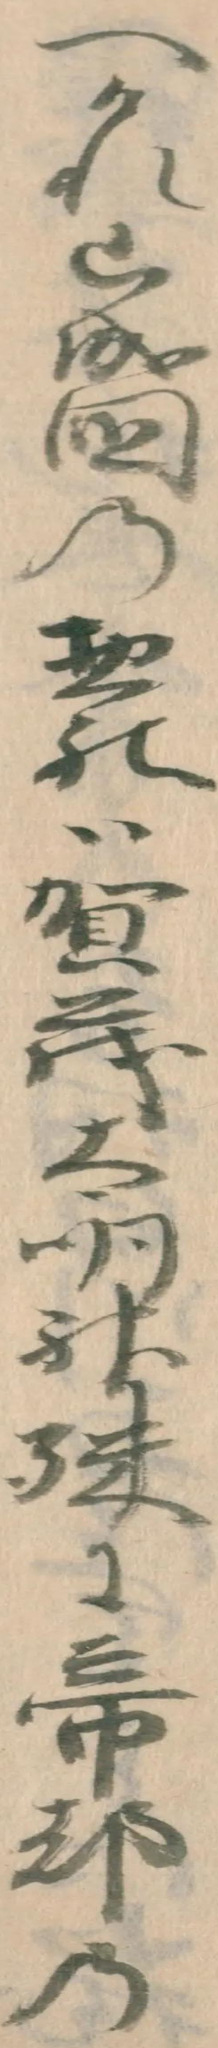へけれ山城国の惣社は賀茂太明神殊に帝都の
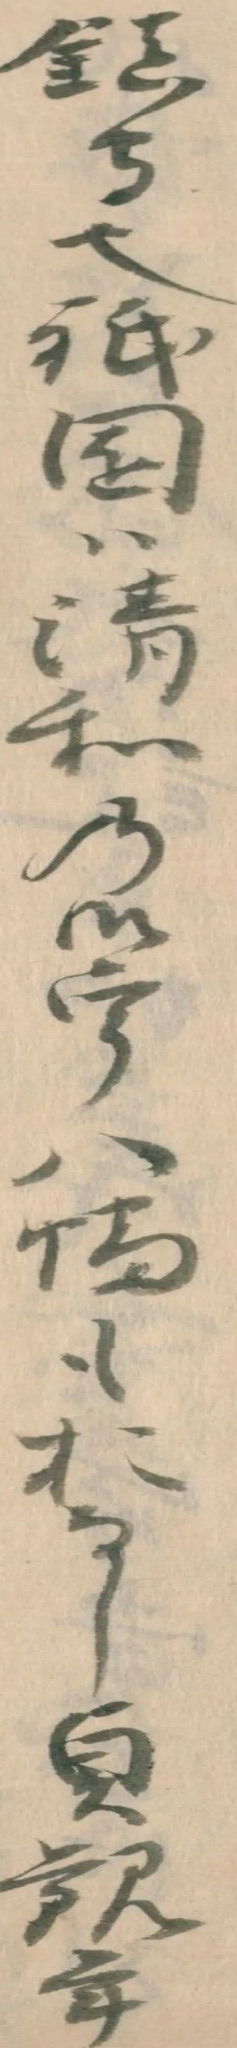鎮守也祇園は清和の御宇八幡もおなし貞観年
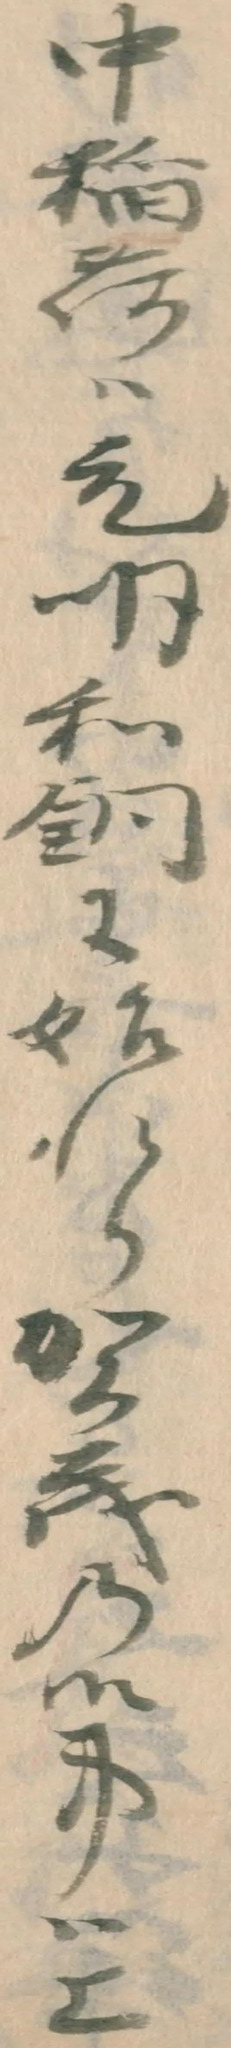中稲荷は元明和銅に始れり賀茂の御事は上
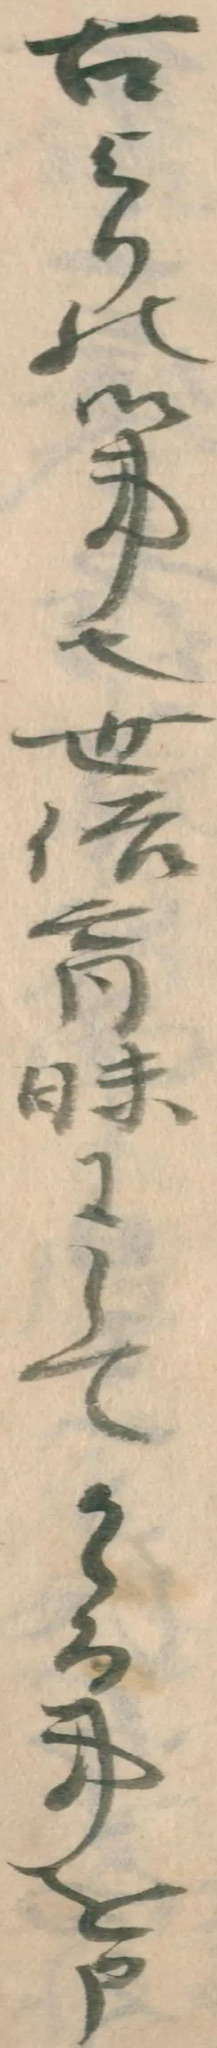古よりの御事也世俗盲昧にしてかゝる事を申
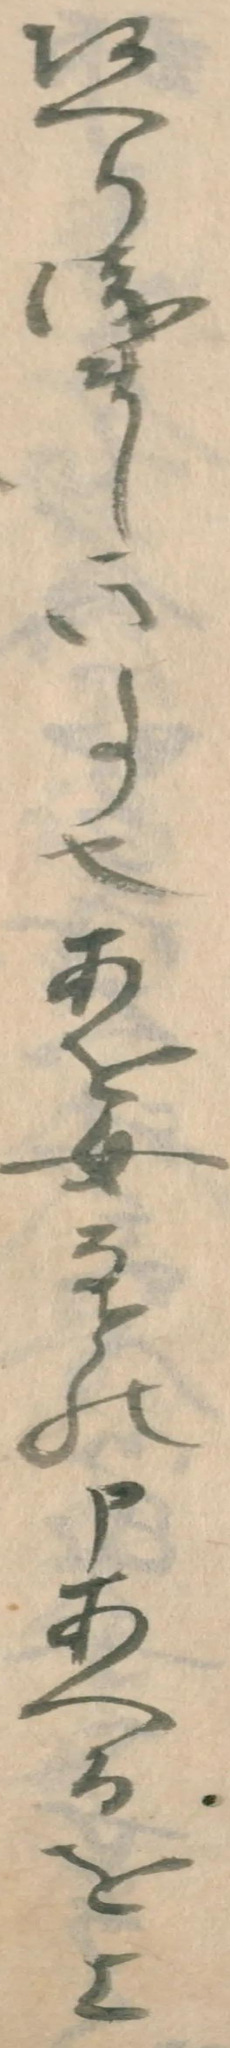あへり浅ましき事也あを女なとの申あへるを上
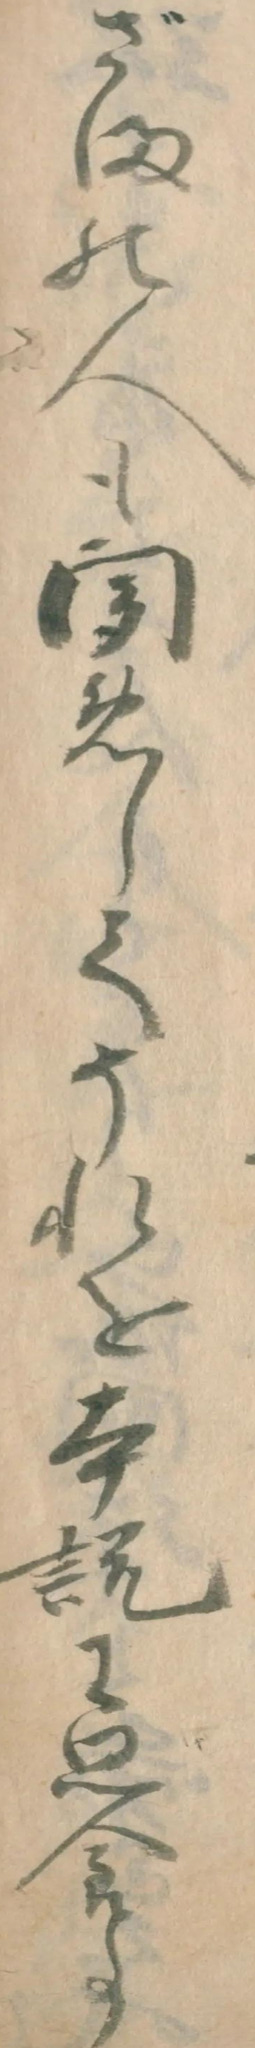ざまの人も聞めしてそれを本説に思食事

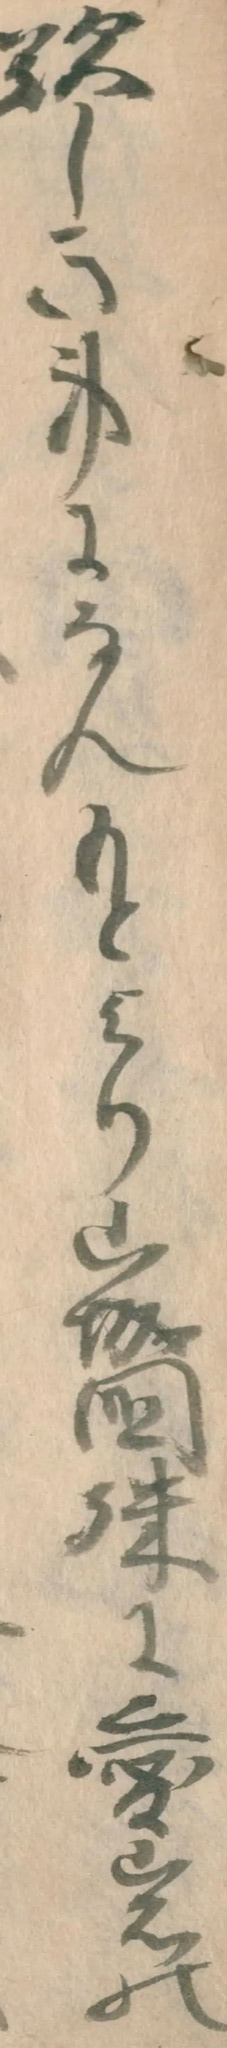歎しき事になんもとより山城国殊に愛宕の
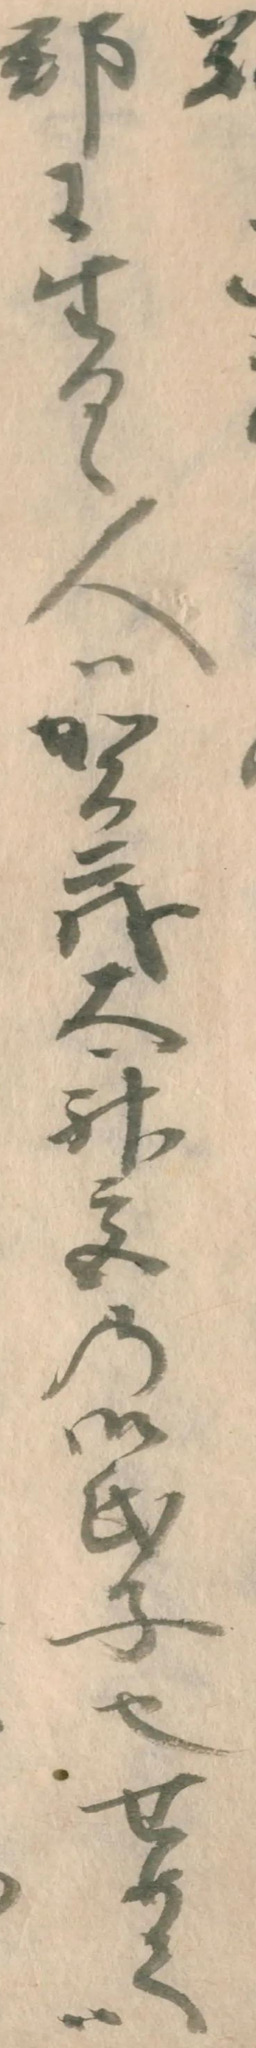郡に生るゝ人は賀茂太神宮の御氏子也せめては
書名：賀茂社記録. 第1冊
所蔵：国立国会図書館 National Diet Library, JAPAN
